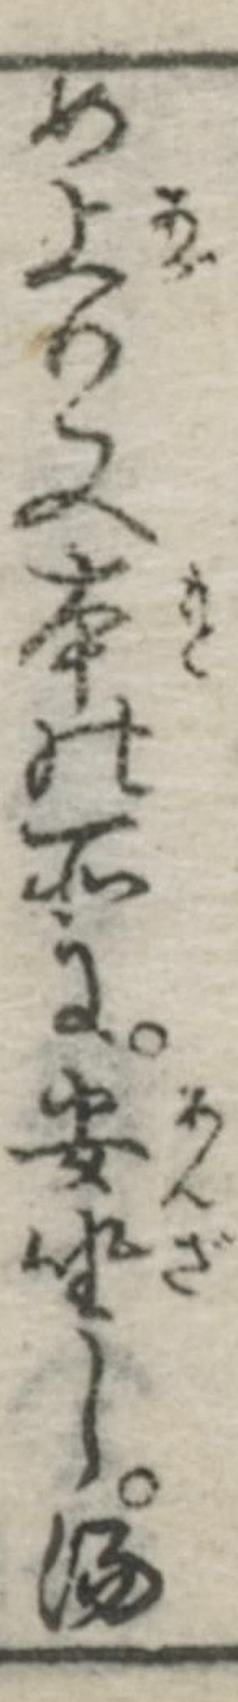め上り又本の所に。安座し。湯
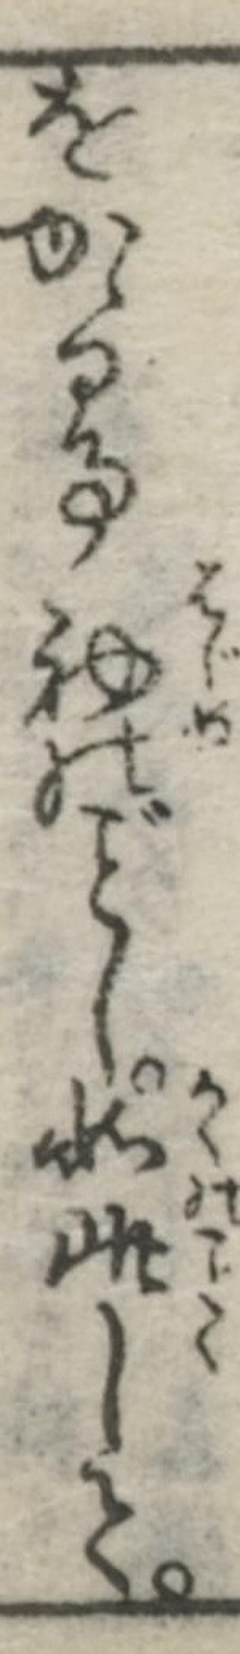をかる事初のごとし。如此して。
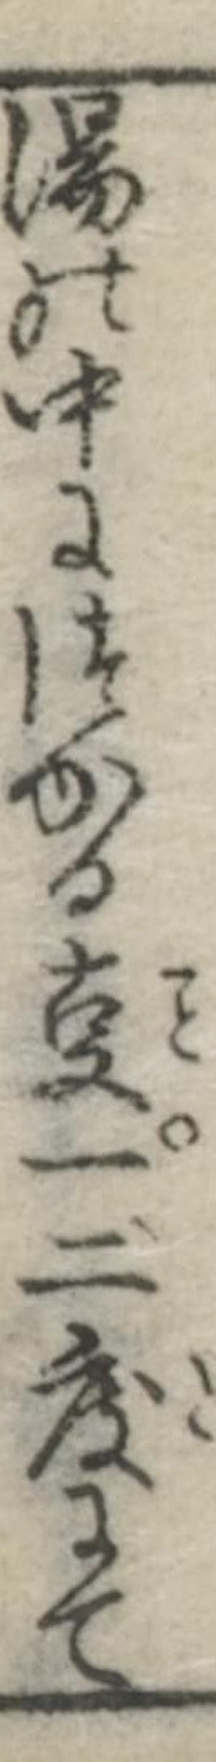湯の中につかる事。一二度にて

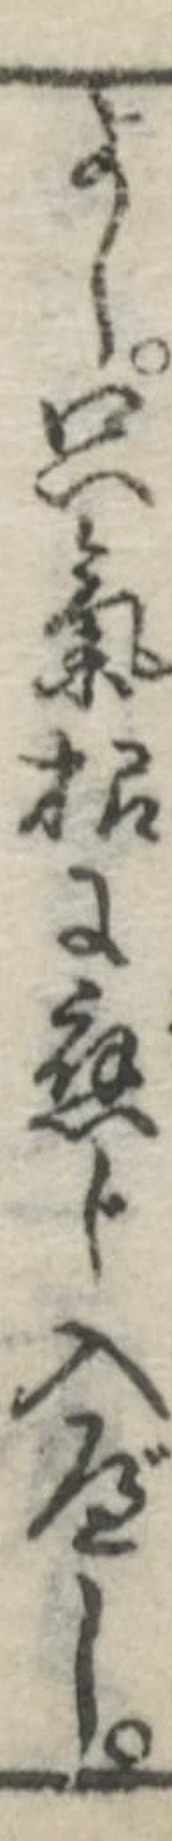よし。只気根に応じ入べし。
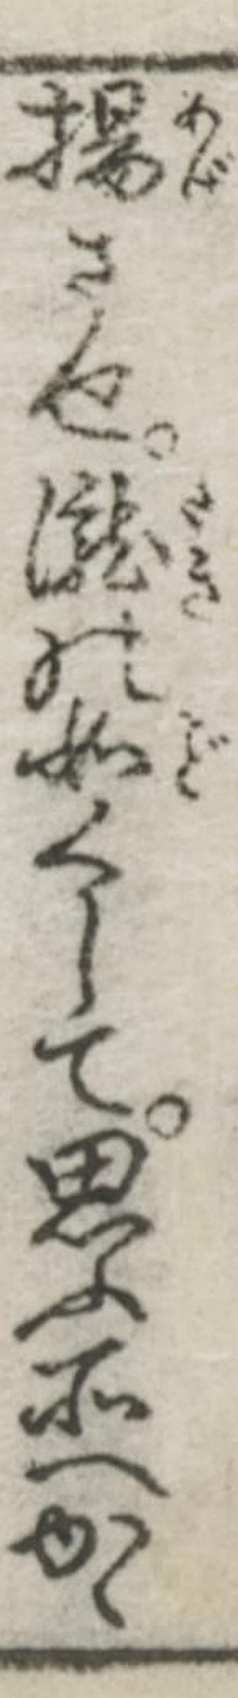揚させ。瀧の如くして。思ふ所へかゝ
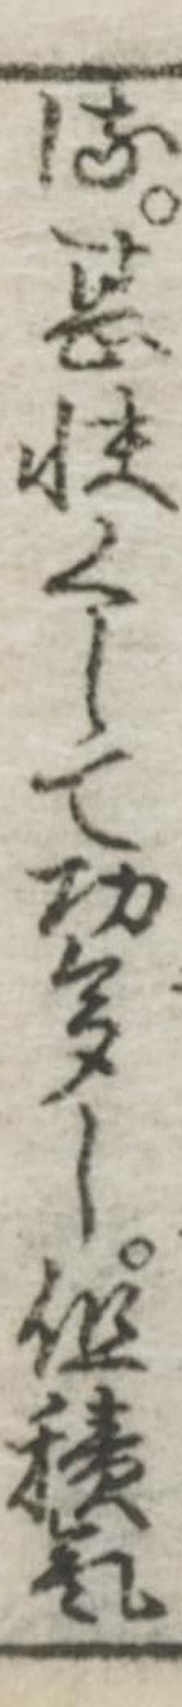る。甚快くして功多し。但積気
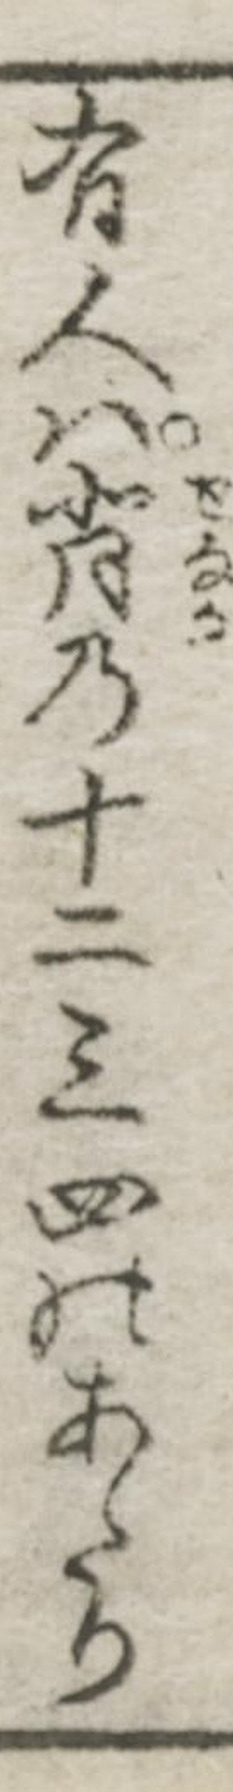有人は。背の十二三四のあたり
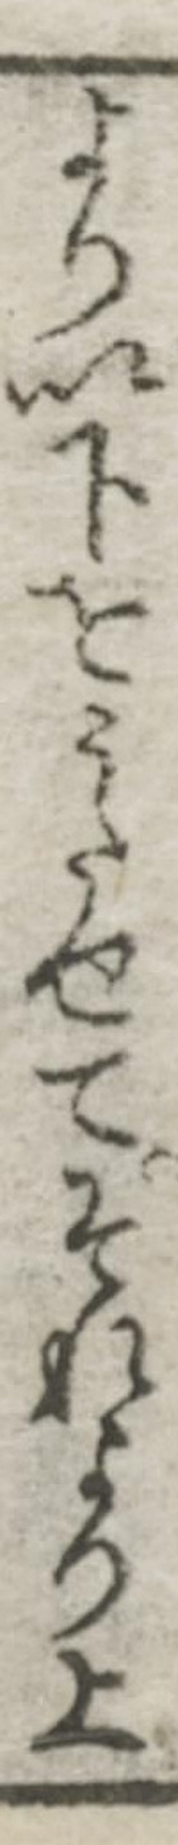より以下をうたせて。それより上
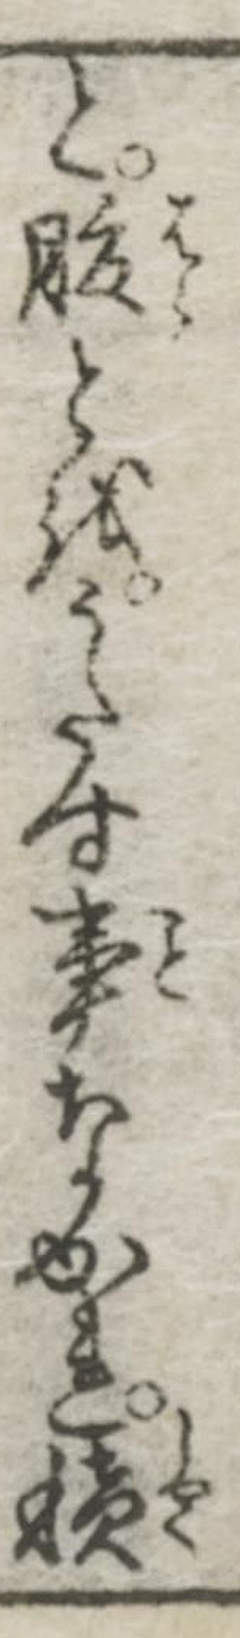と。腹とを。うたす事なかれ。積
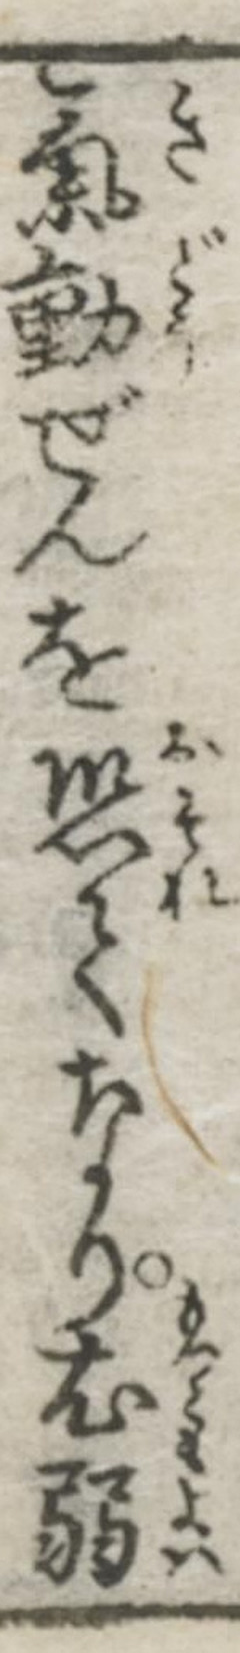気動ぜんを恐てなり。尤弱
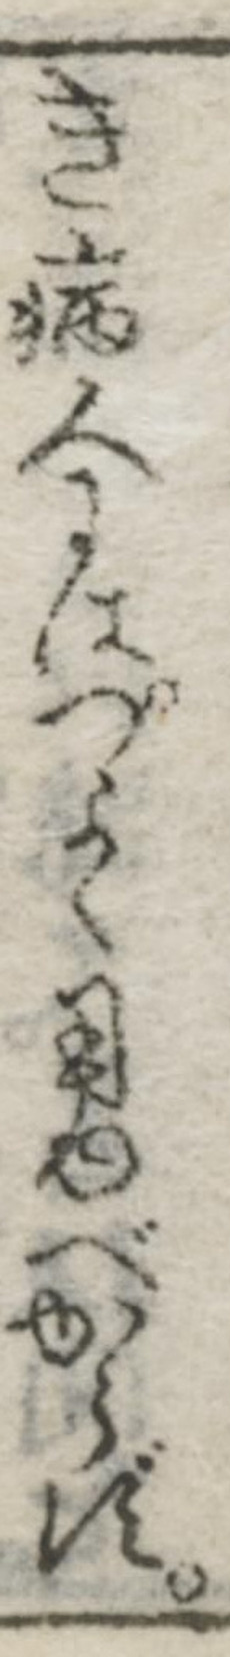き病人には。つよく用ゆべからず。
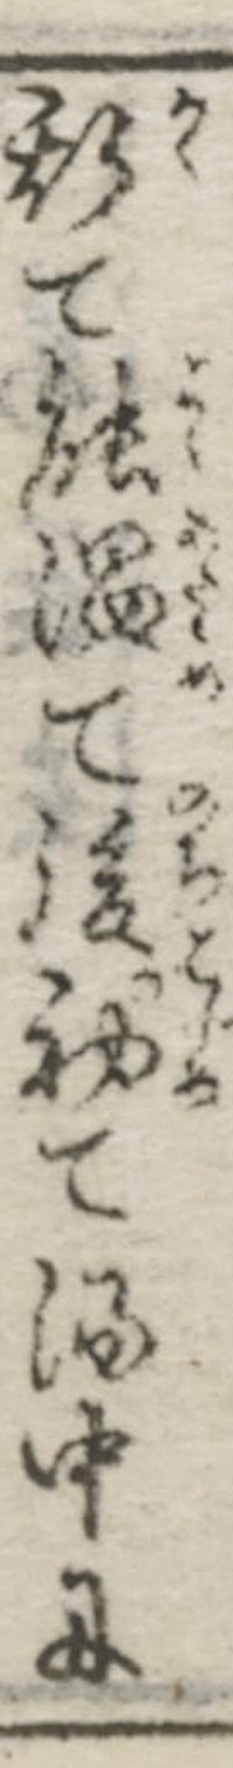斯て能温て後。初て湯中に
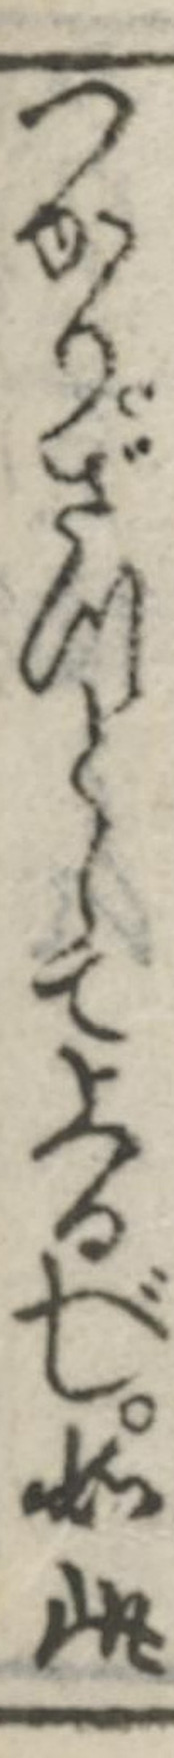つかり。ざつとして上るべし。如此
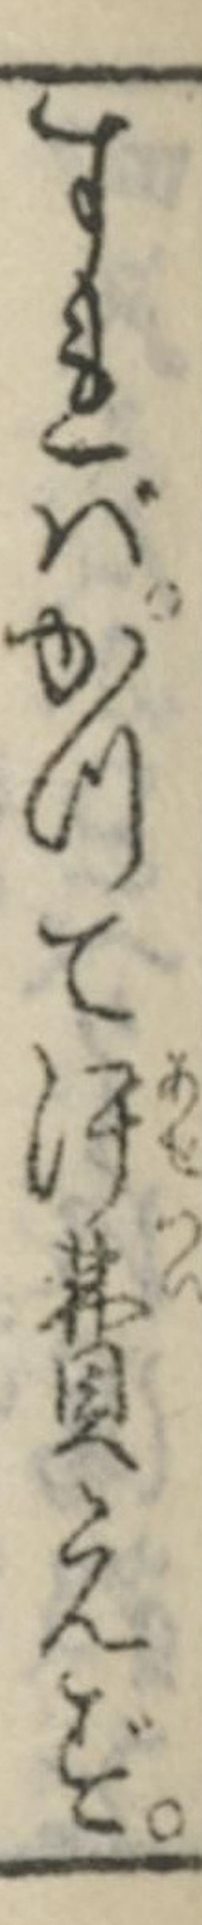すれば。かつて汗費えず。
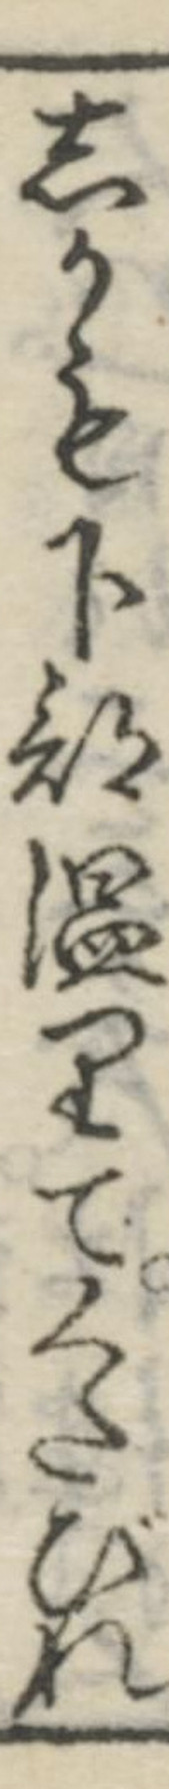しかも下部温りて。くたびれ
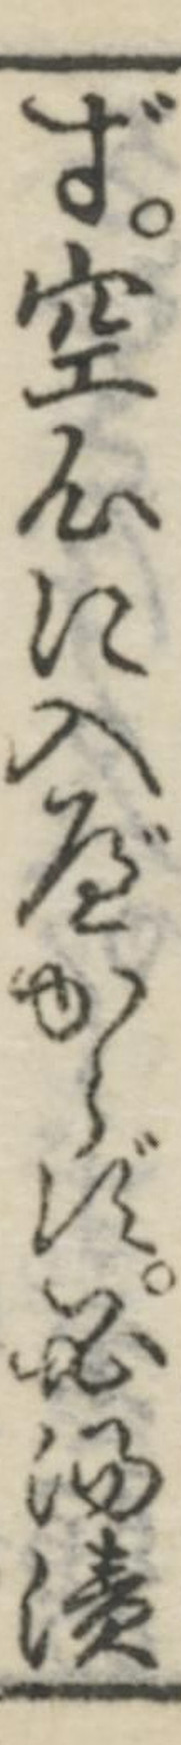ず。空心に入べからず。必湯漬
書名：但州城崎浴湯辧
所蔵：東京大学地震研究所図書室 Earthquake Research Institute Library, The University of Tokyo, JAPAN
